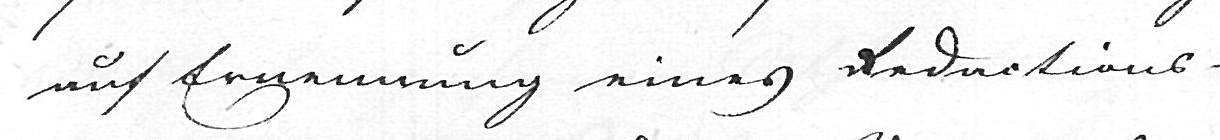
auf Ernennung eines Redactions-
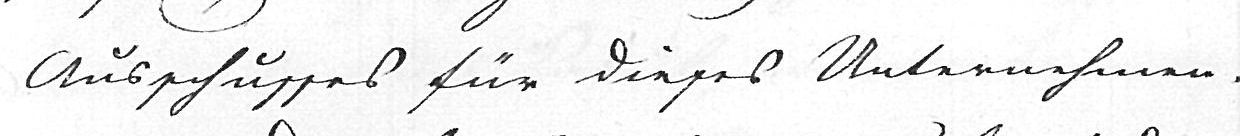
Ausschusses für dieses Unternehmen.
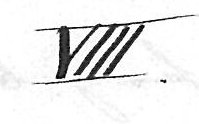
VIII.
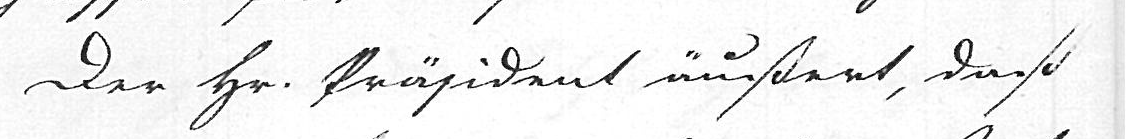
Der Hr. Präsident äußert, daß
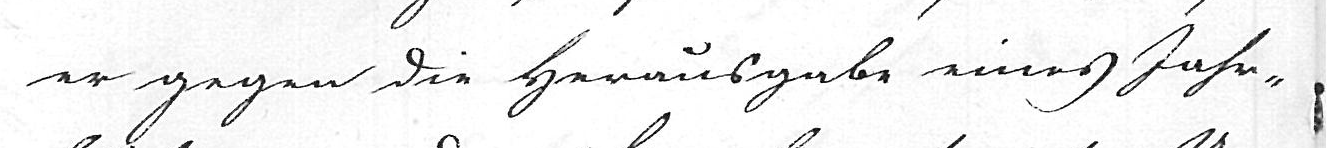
er gegen die Herausgabe eines Jahr-
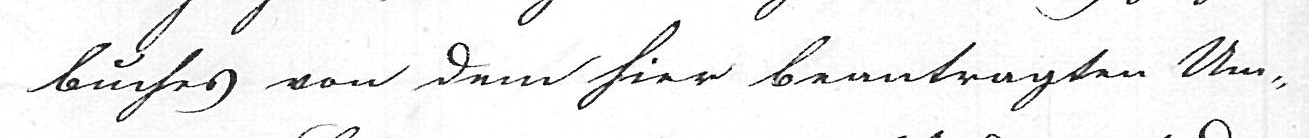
buches von dem hier beantragten Um-
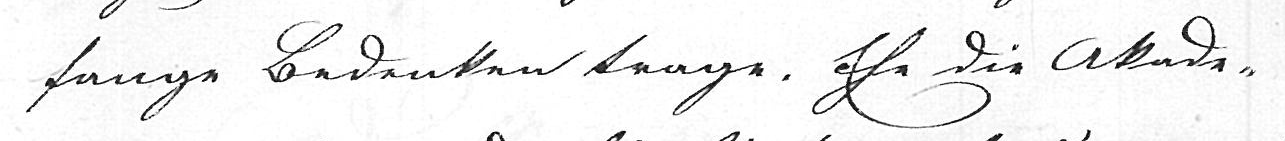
fangen Bedenken trage. Ehe die Akade-
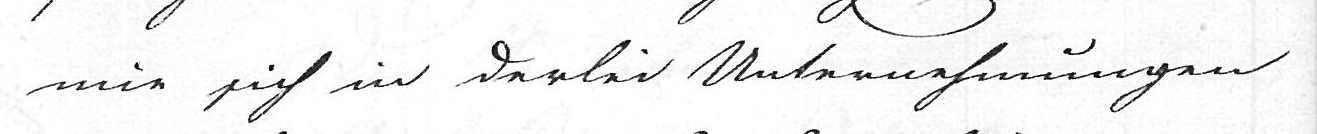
mie sich in derlei Unternehmungen
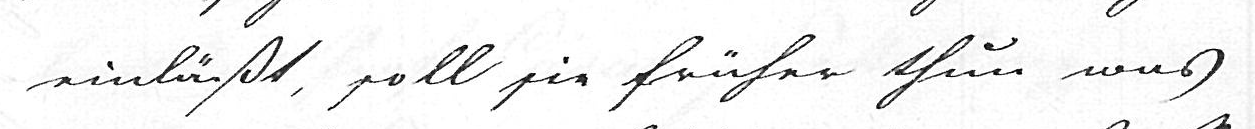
einläßt, soll sie früher thun was
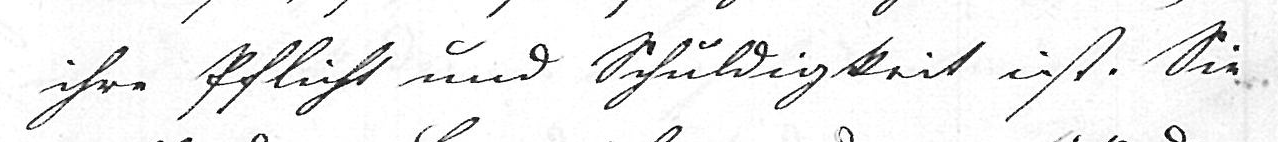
ihre Pflicht und Schuldigkeit ist. Sie
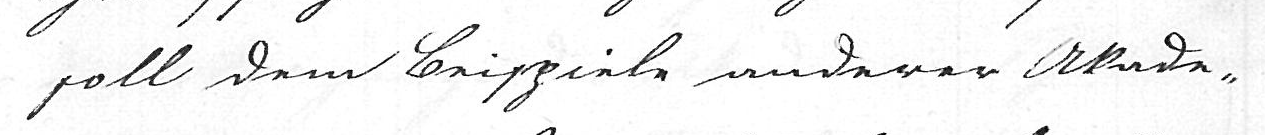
soll dem Beispiel anderer Akade-
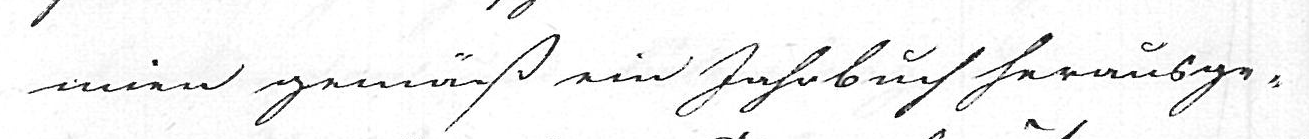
mien gemäß ein Jahrbuch herausge-
